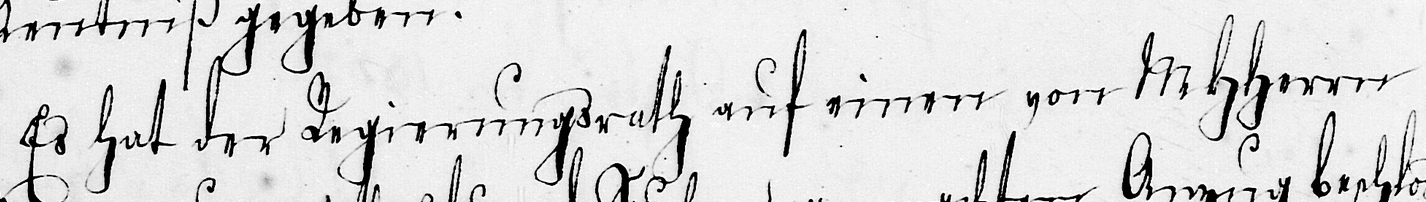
Es hat der Regierungsrath auf einen von MHHerrn
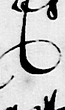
“
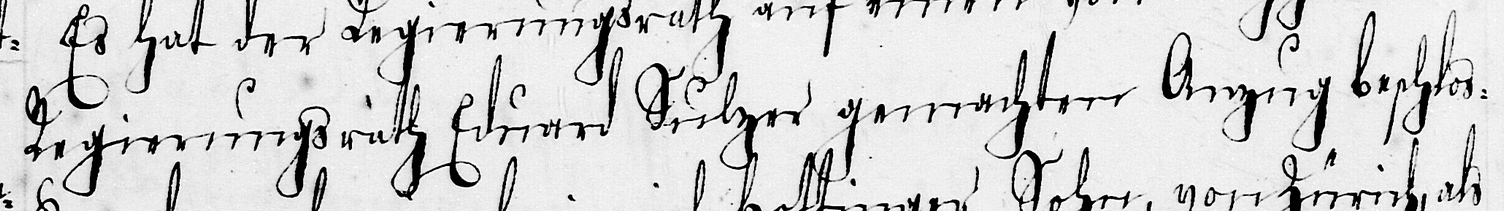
Regierungsrath Eduard Sulzer gemachten Anzug beschloß¬
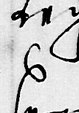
h.)
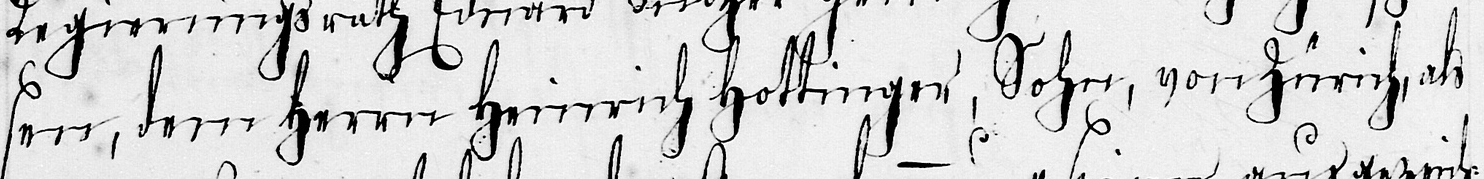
en, dem Herrn Heinrich Hottinger, Sohn, von Zürich, als
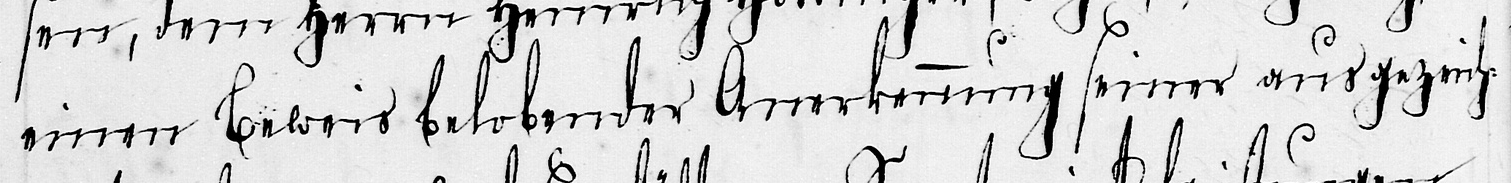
einen Beweis belobender Anerkennung seiner ausgezeich¬
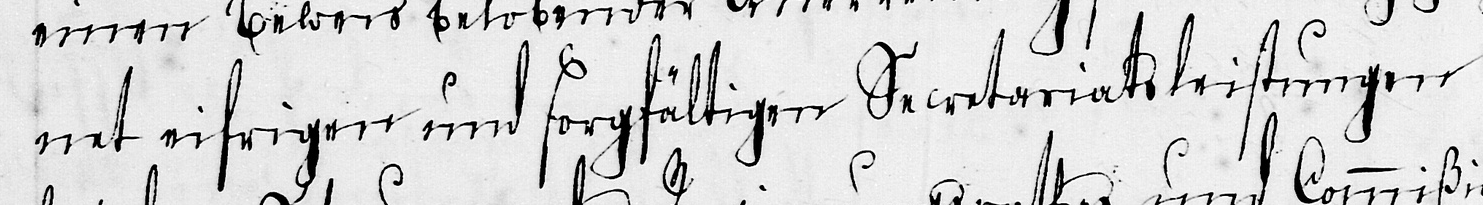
net eifrigen und sorgfältigen Secretariatsleistungen
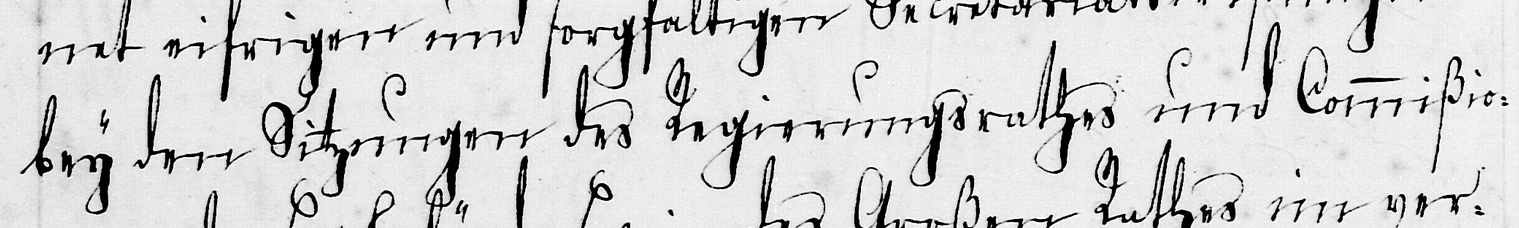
bey den Sitzungen des Regierungsrathes und Commißio¬
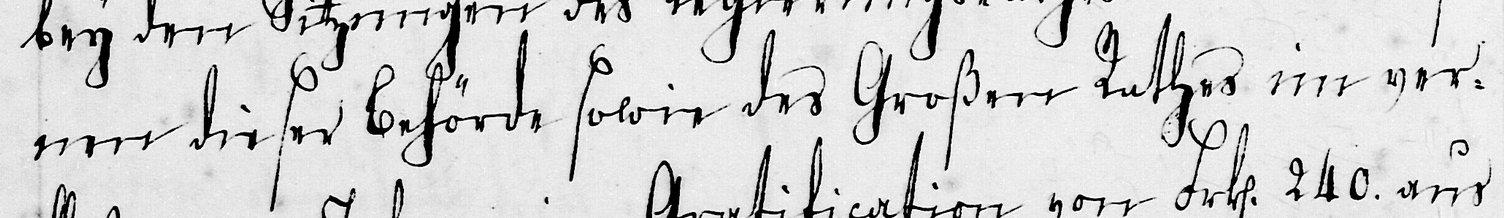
nen dieser Behörde sowie des Großen Rathes im ver¬
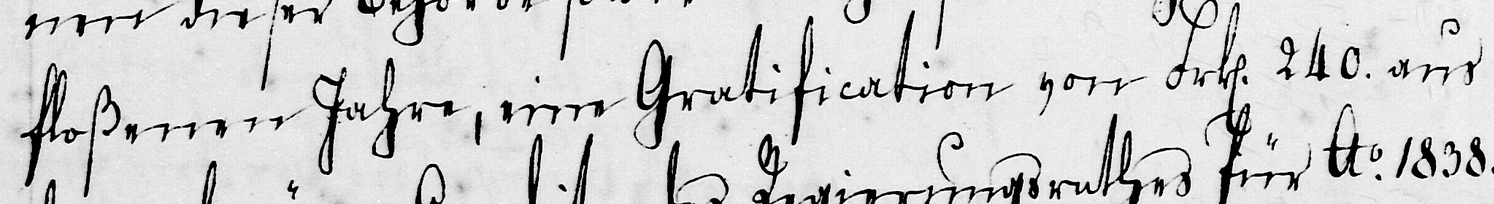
floßenen Jahre, eine Gratification von Frk[en]. 240. aus
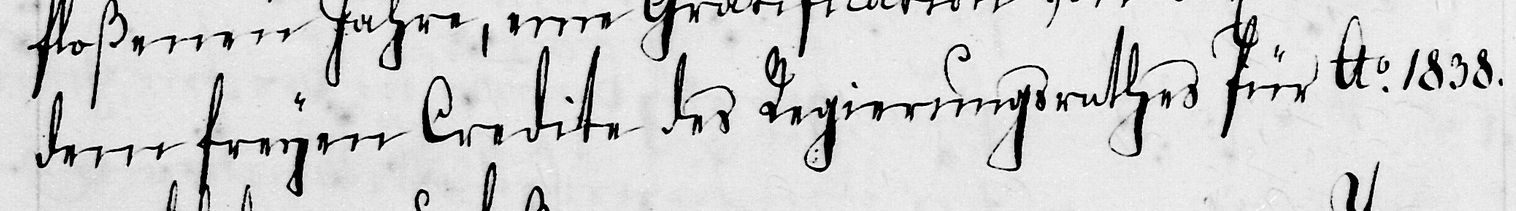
dem freyen Credite des Regierungsrathes für Ao. 1838.
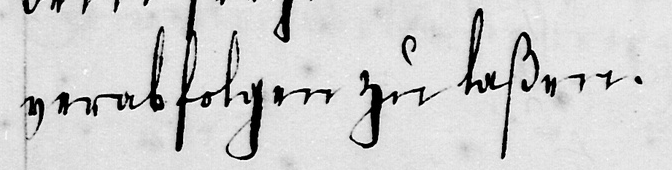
verabfolgen zu laßen.
